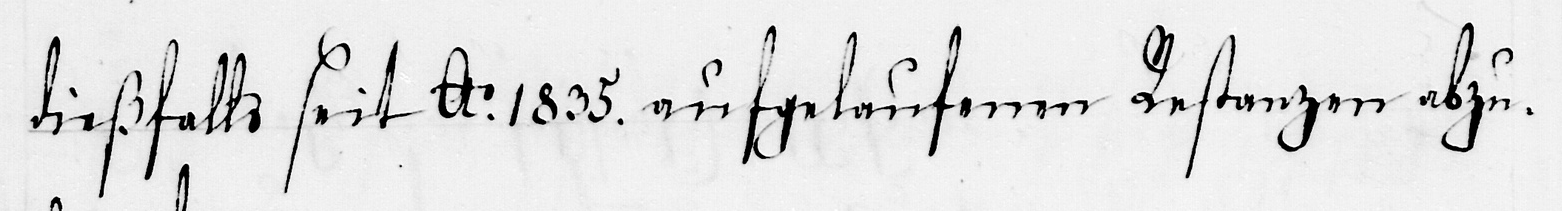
dießfalls seit Ao. 1835. aufgelaufenen Restanzen abzu¬
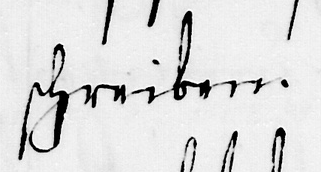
schreiben.
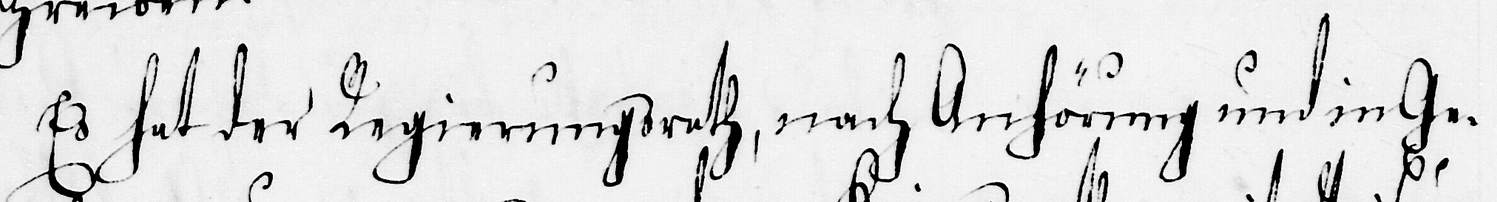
Es hat der Regierungsrath, nach Anhörung und in Ge¬
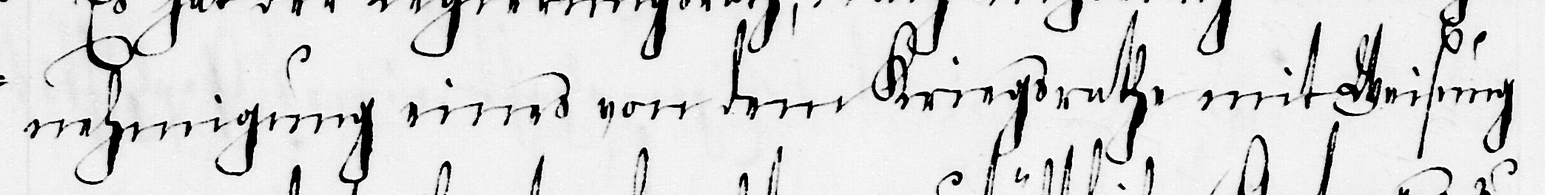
nehmigung eines von dem Kriegsrathe mit Weisung
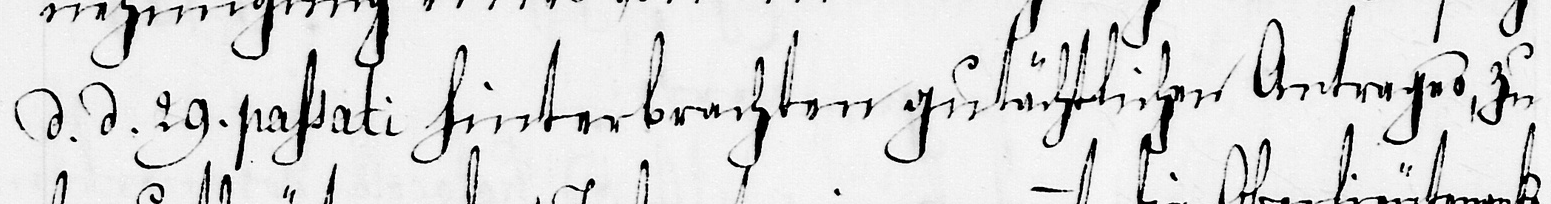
d. d. 29. passati hinterbrachten gutächtlichen Antrages, zu
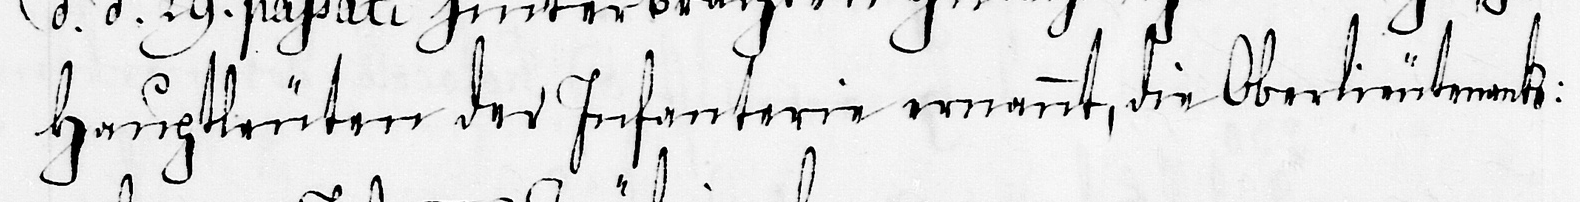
Hauptleuten der Infanterie ernannt, die Oberlieutenants:
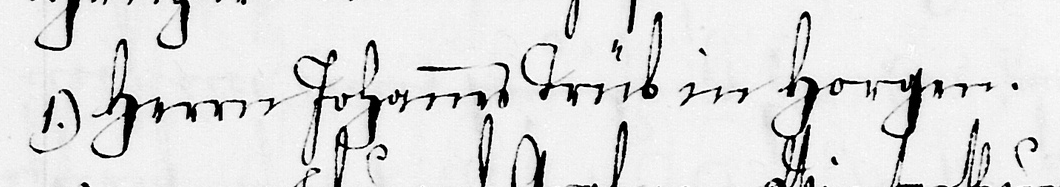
1.) Herrn Johannes Trüb in Horgen.
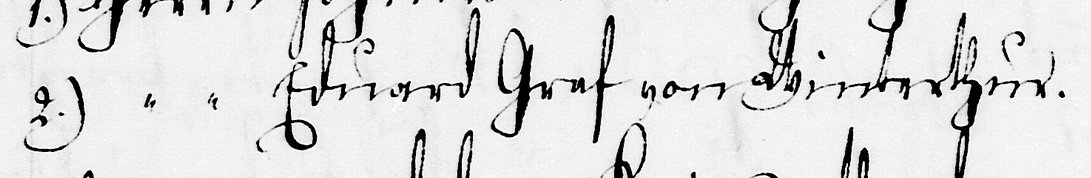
2.) “ Eduard Graf von Winterthur.
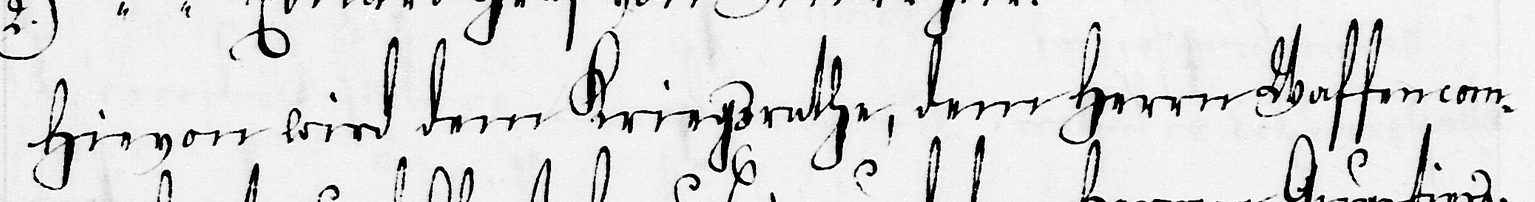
Hievon wird dem Kriegsrathe, dem Herrn Waffencom¬
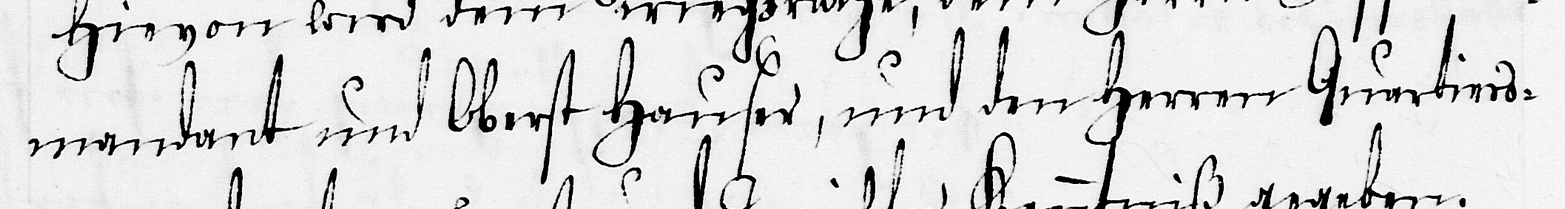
mandant und Oberst Hauser, und den Herren Quartiers¬
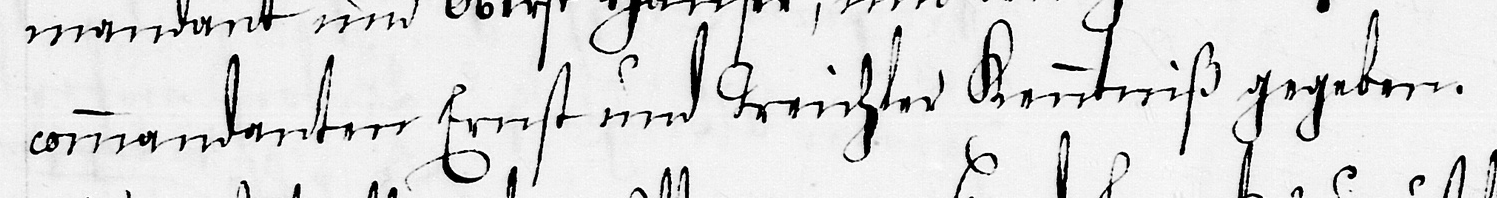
commandanten Ernst und Treichler Kenntniß gegeben.
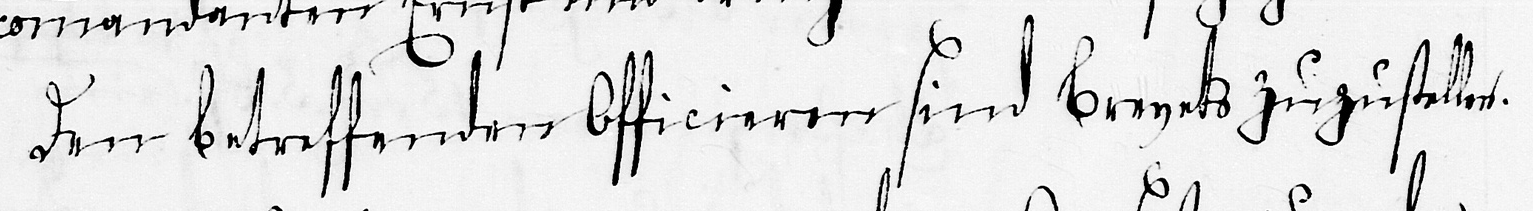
Den betreffenden Officieren sind Brevets zuzustell¬
